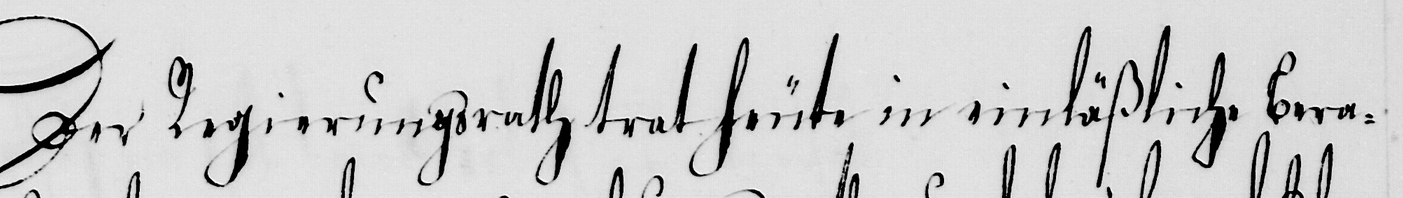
Der Regierungsrath trat heute in einläßliche Bera¬
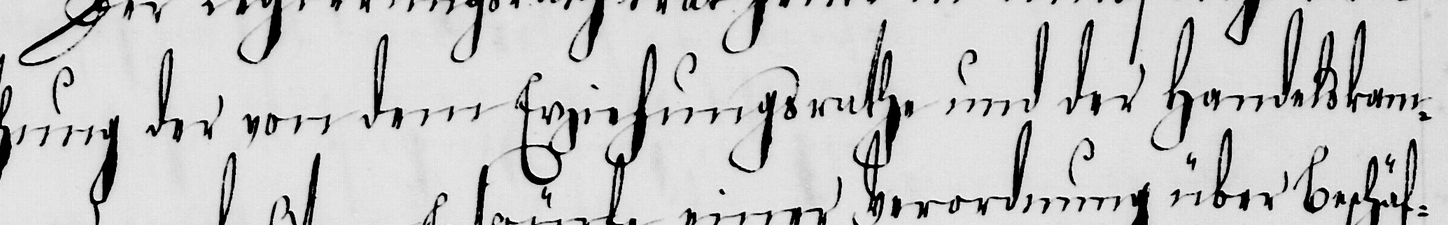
ung der von dem Erziehungsrathe und der Handelskam¬
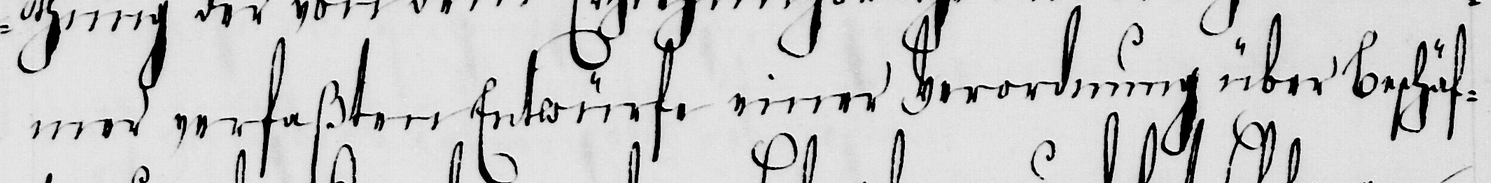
mer verfaßten Entwürfe einer Verordnung über Beschäf¬
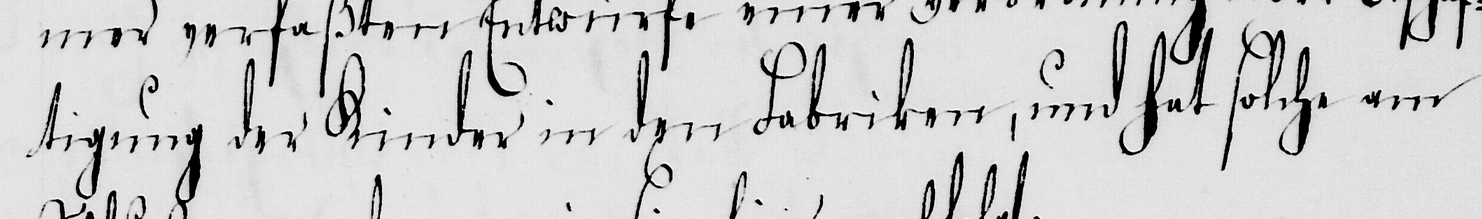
tigung der Kinder in den Fabriken, und hat solche am
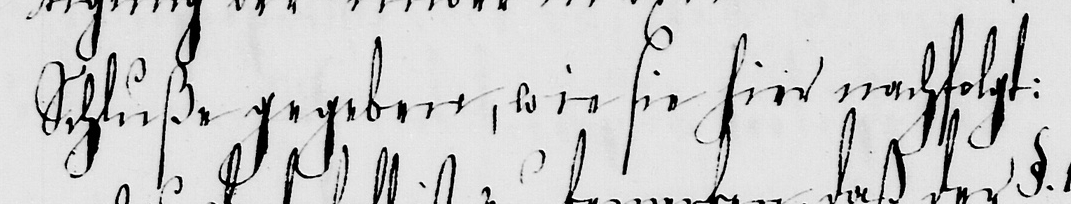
Schluße gegeben, wie sie hier nachfolg¬
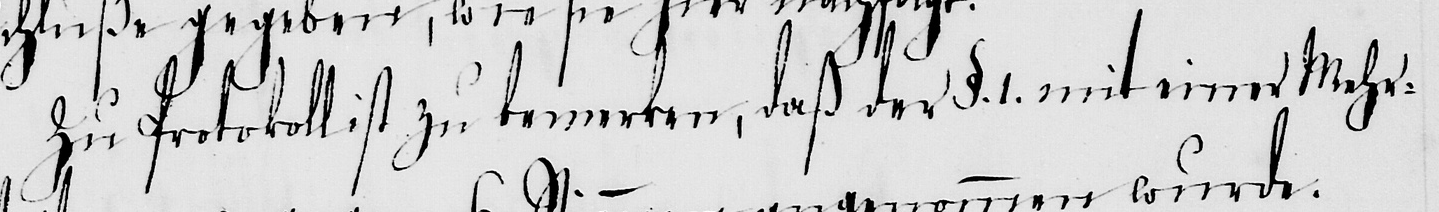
Zu Protokoll ist zu bemerken, daß der §. 1. mit einer Mehr¬
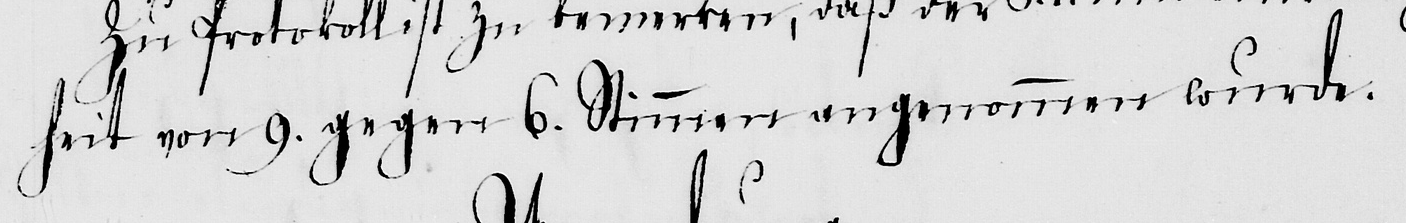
heit von 9. gegen 6. Stimmen angenommen wurde.
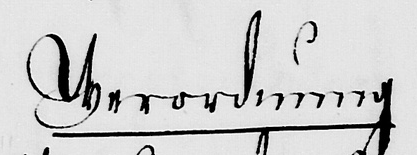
Verordnung
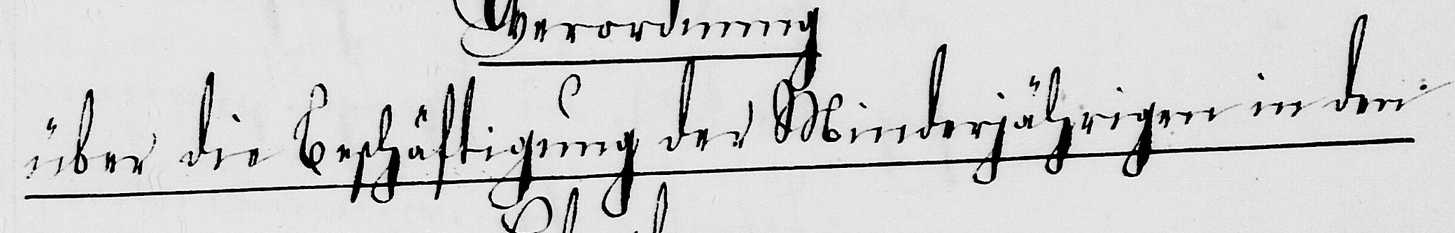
über die Beschäftigung der Minderjährigen in den
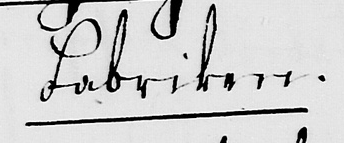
Fabriken.
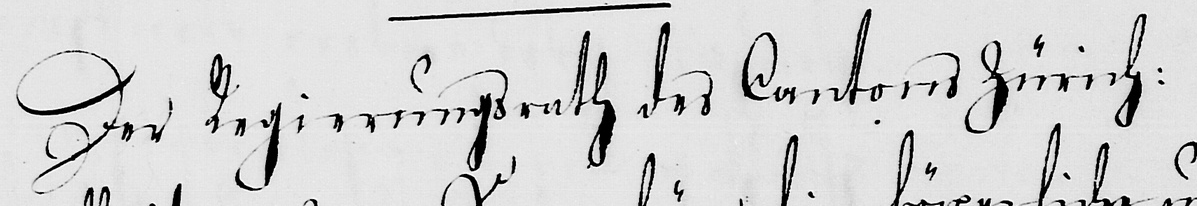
Der Regierungsrath des Cantons Zürich:
